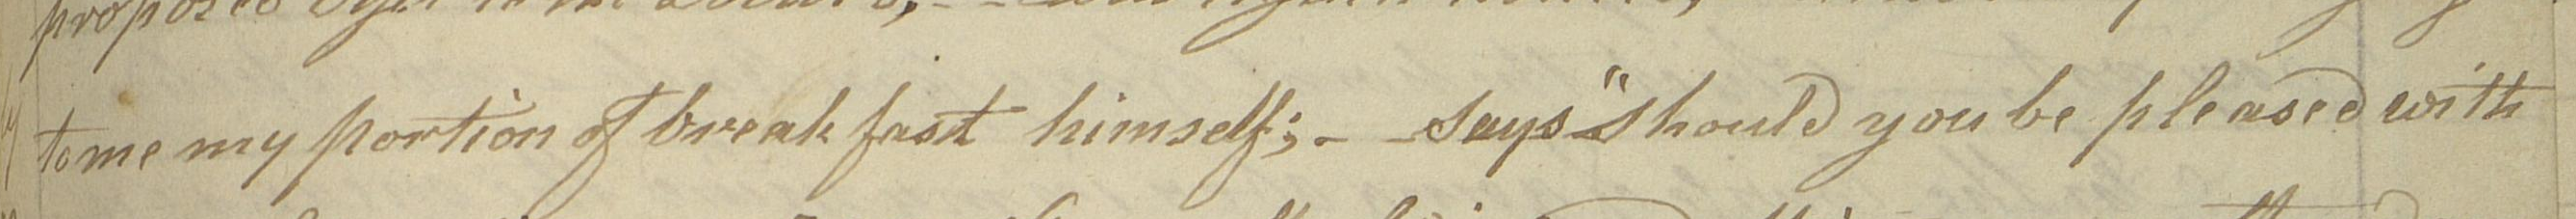to me my portion of breakfast himself; says "should you be pleased with
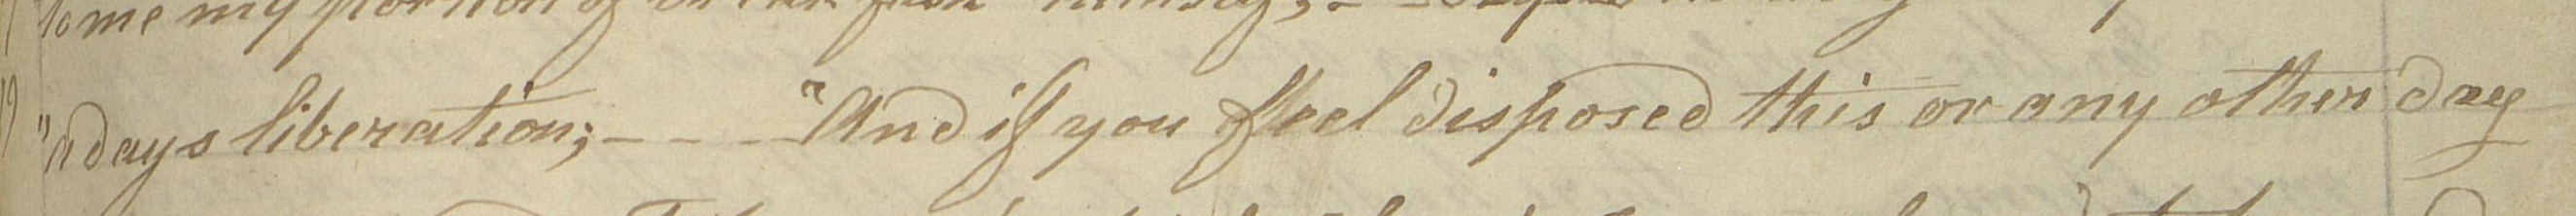"a days liberation; "And if you feel disposed this many other day
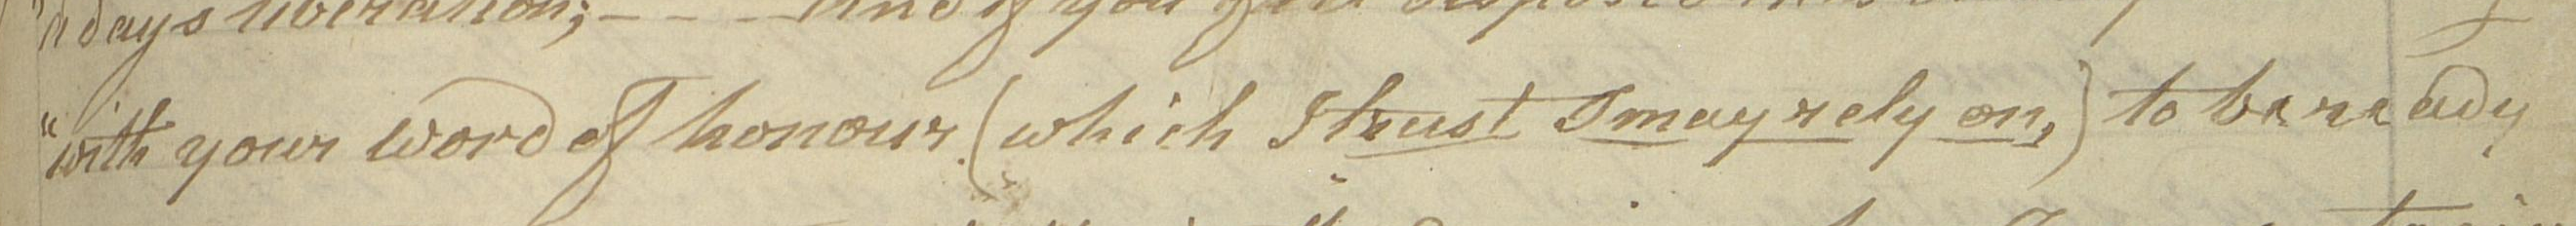"with your word of honour (which I trust I may rely on,) to be ready
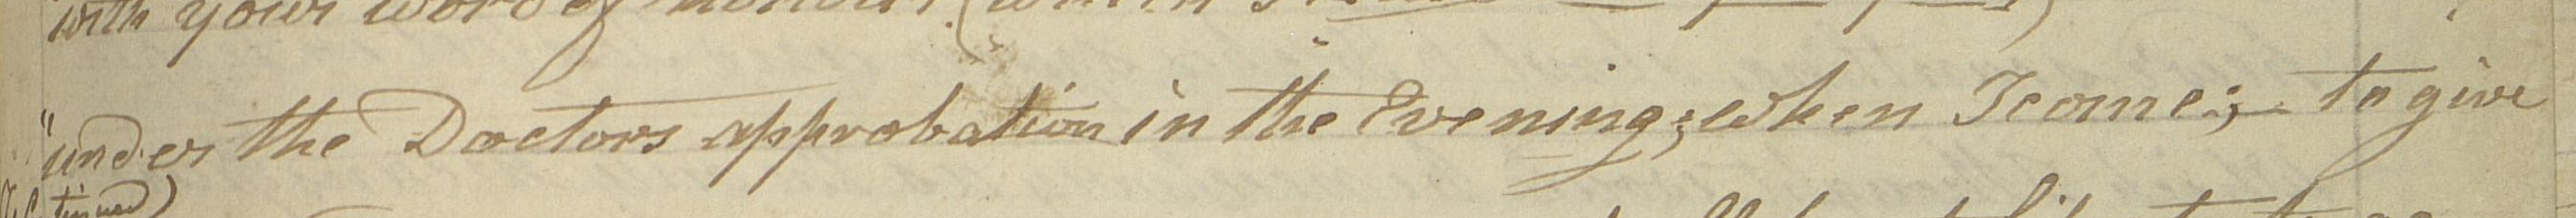under the Doctors approbation in the Evening, when I come; to give
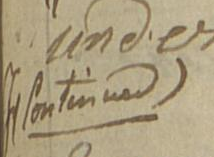Continued)
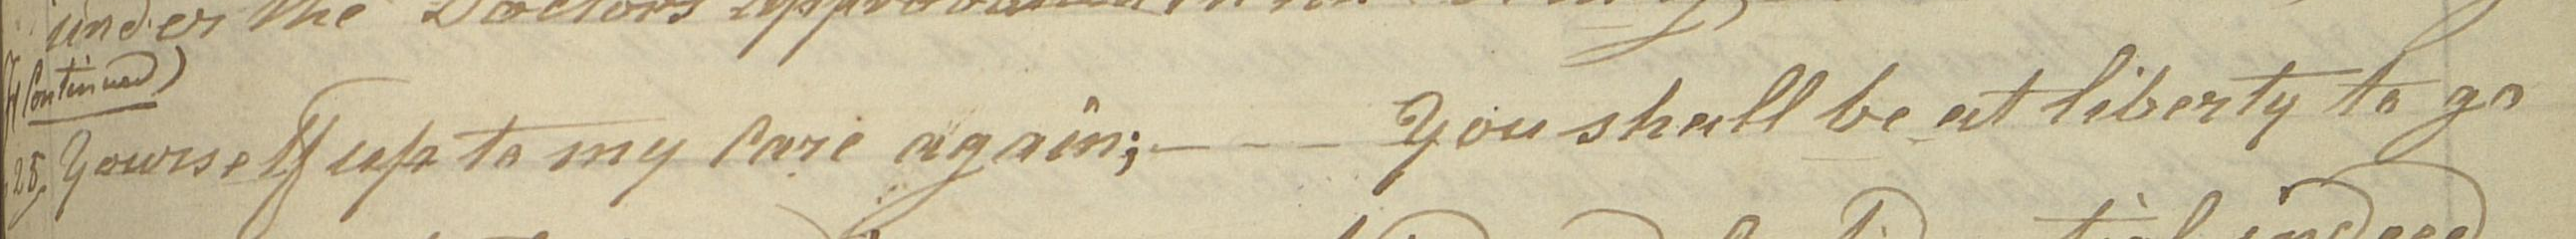Yourself up to my care again; You shall be at liberty to go
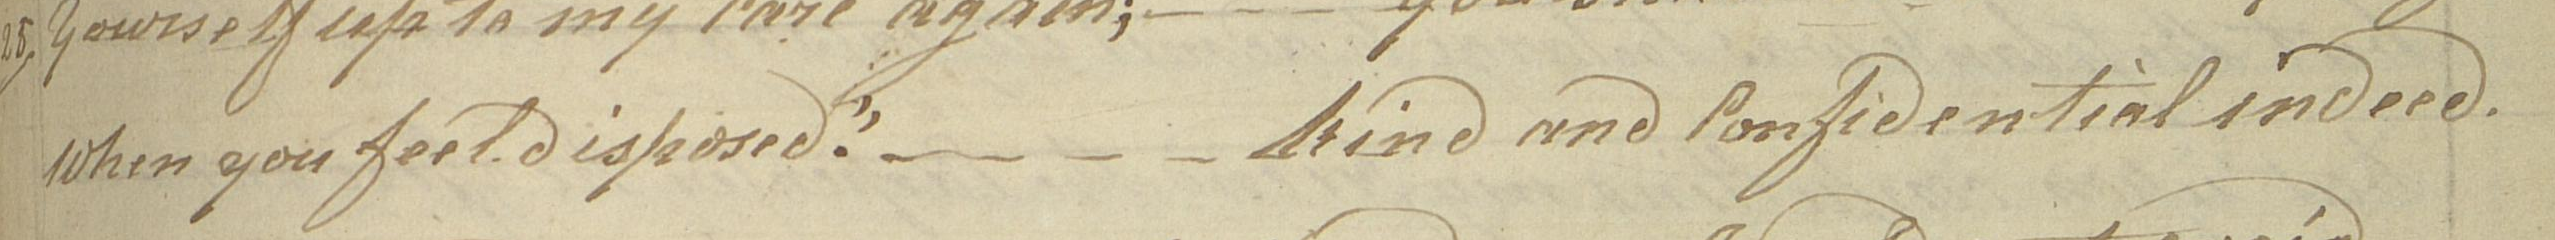when you feel disposed." kind and Confidential indeed.
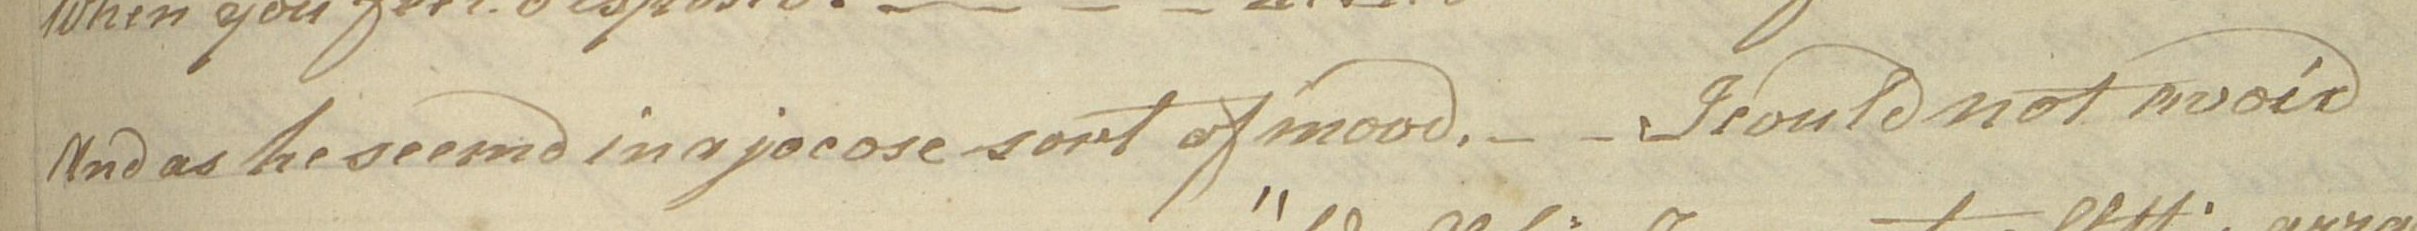And as he seemd in a jocose sort of mood. I could not avoid
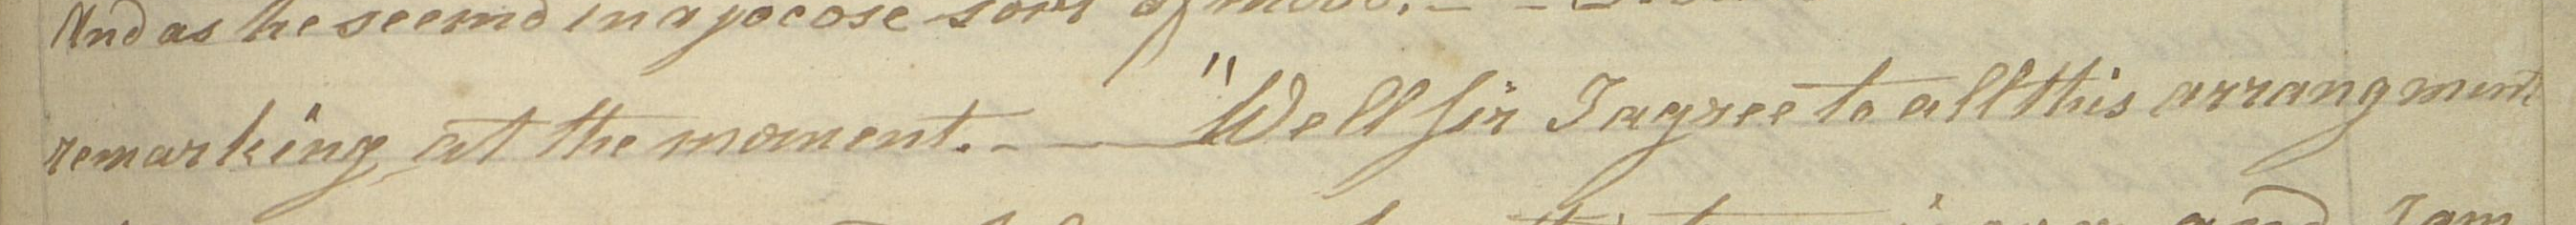remarking at the moment. "Well Sir I agree to all this arrangement
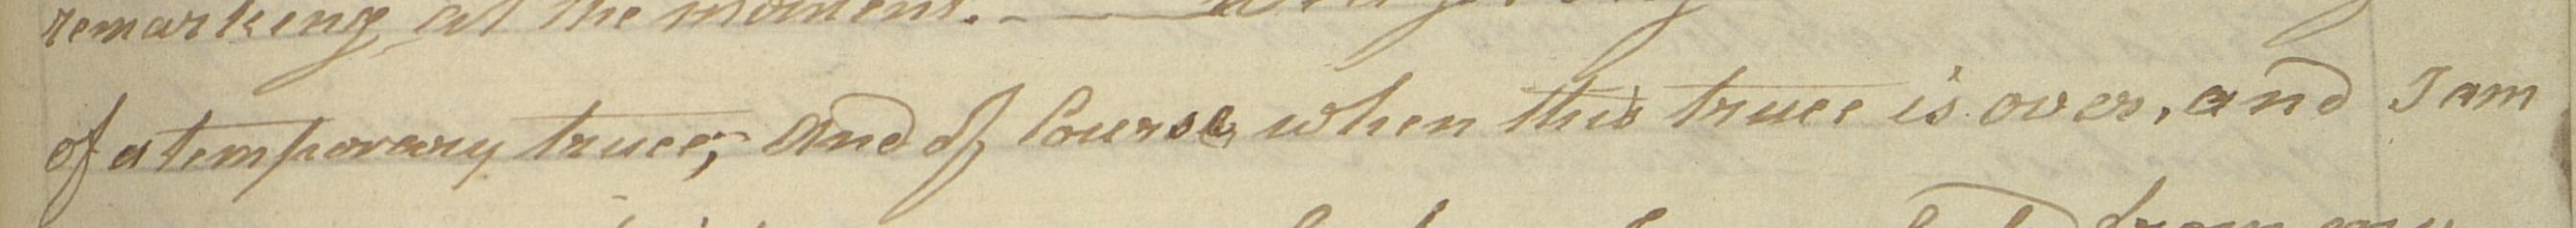of a temporary truce; and of Course when this true is over, and I am
